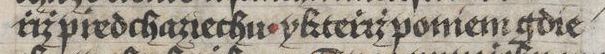ṙiż pṙedchaziechu.y kteříž poniem gdie¬
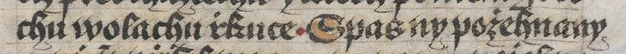chu volachu ṙkuce.Spas ny požehnany
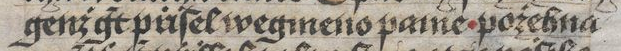genž ḡt pṙiẛel we gmeno paníe.požehna¬
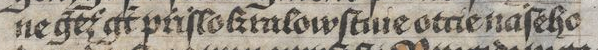ne gēż ḡt pṙiẛle kralowſtine otcie naẛeho.
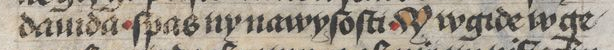dauida.ſpas ny wyſoſti.Yvgde w ge¬
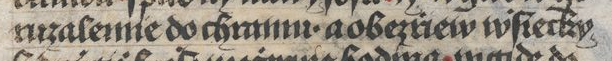ruzalemie do chramu.a obezṙiew wẛiecky
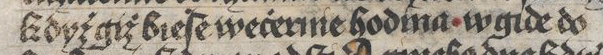kdyż giż bíeẛe weċernie hodina.wgide do¬
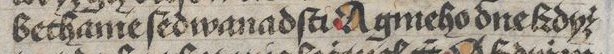bethaníe ſe dwanadſti.A gmeno dne když
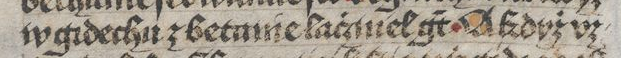wgidechu zetaya élaċaziel gt.A když vz¬
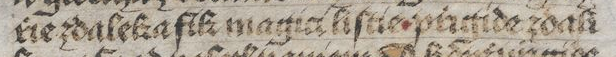ṙíe ža leka fik. n a x.xẛikaz AŻko
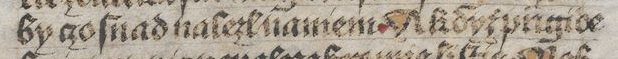by ce ſia A alezl naunevlia.AKkuK2 lgi ze¬
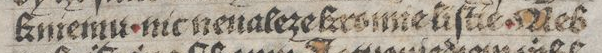kniemu.Mixti ekleže kea lei ſull.)kst.
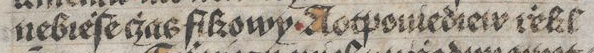nebíeẛe Żat ſikowy.Koto.elieei Žk.l.
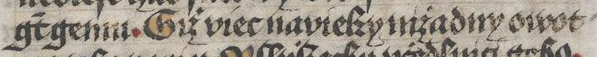ḡt gemu.Giž víec navieky niżadny owot¬
